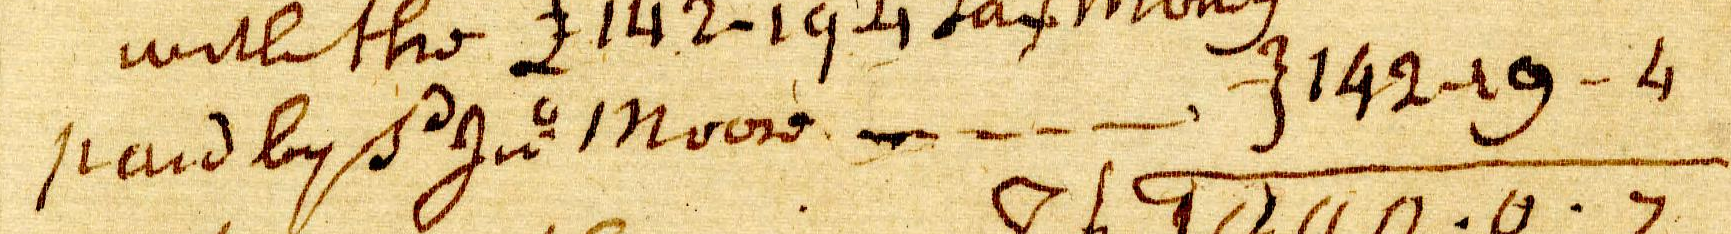[aid by S^d Jn^o Moore...... 142.19.4
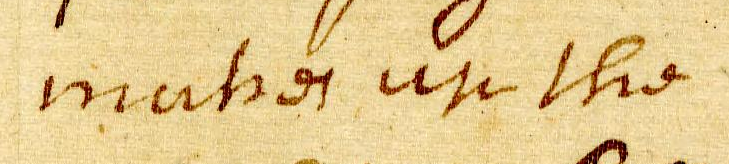makes up the
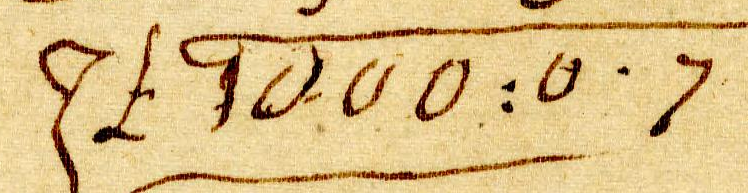£1000:0.7
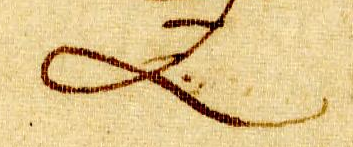£
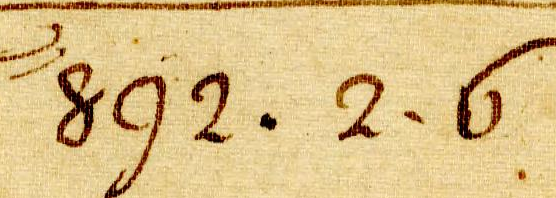892.2.6
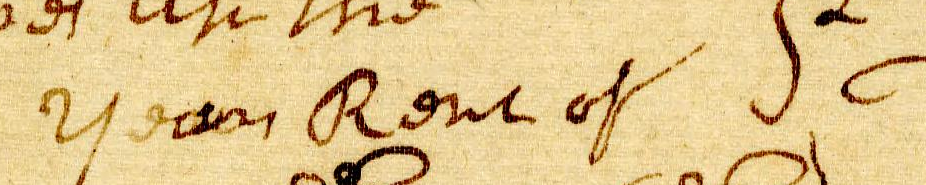Years Rent of
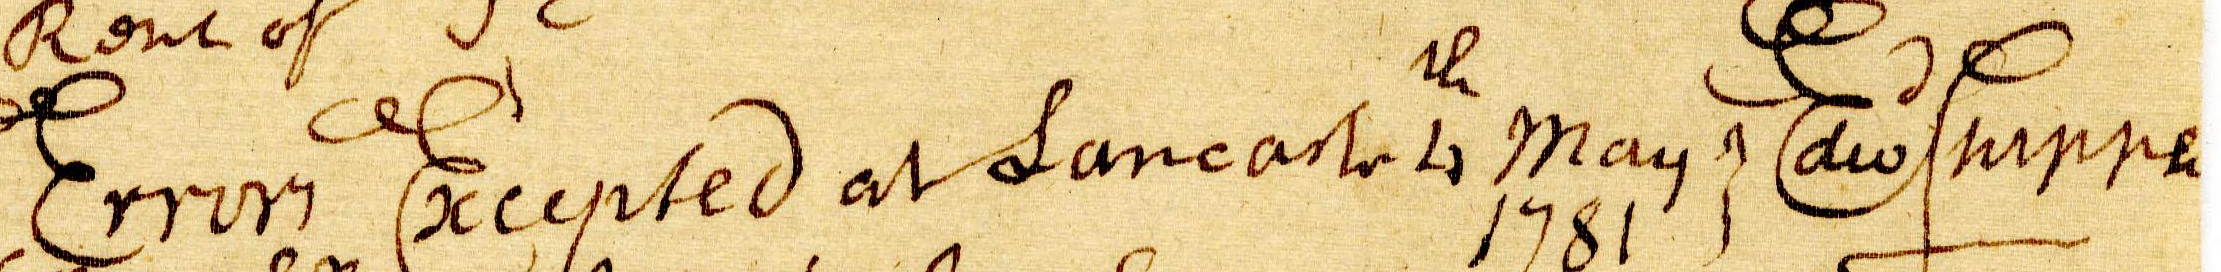Errors Excepted at Lancaster 4^th May Edw^d Shippen
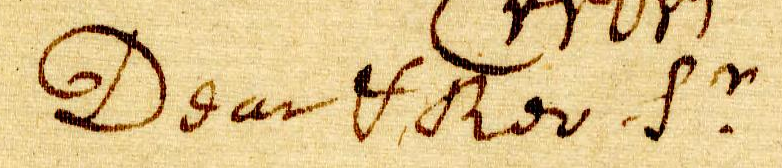Dear & Rev S^r.
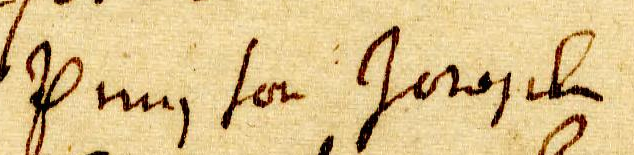per my Son Joseph
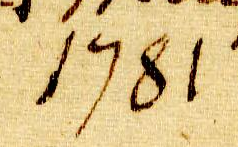1781
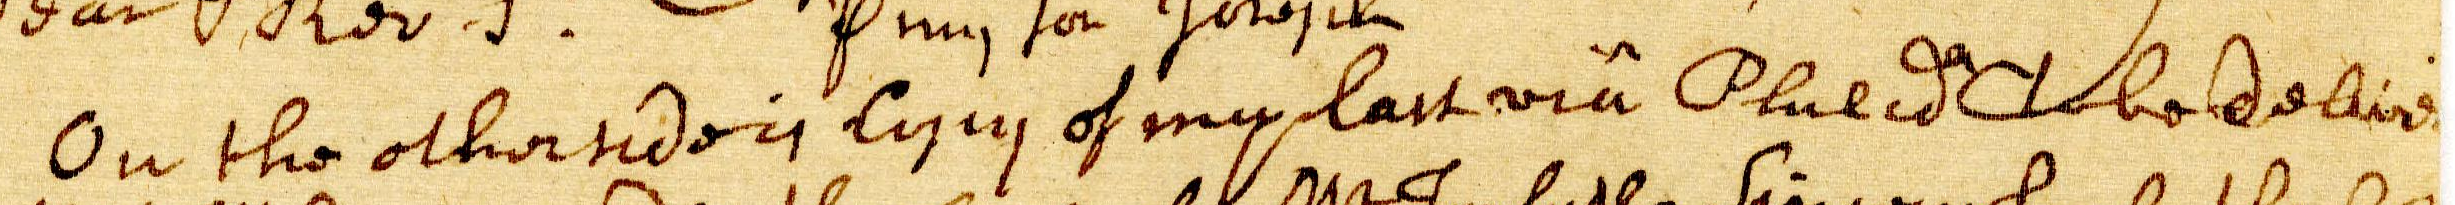On the other side is Copy of my last viz^t Philad^a to be deliver
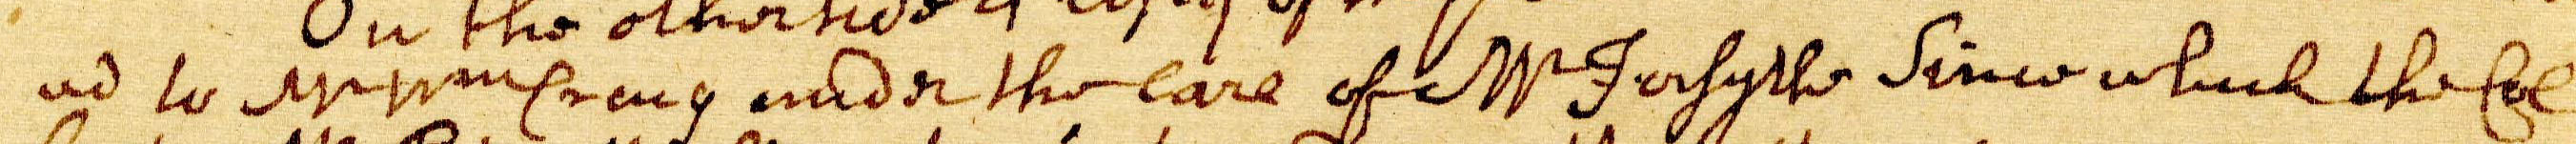ed to M^r W^m Craig under the Care of M^r Forsythe Since which the Col
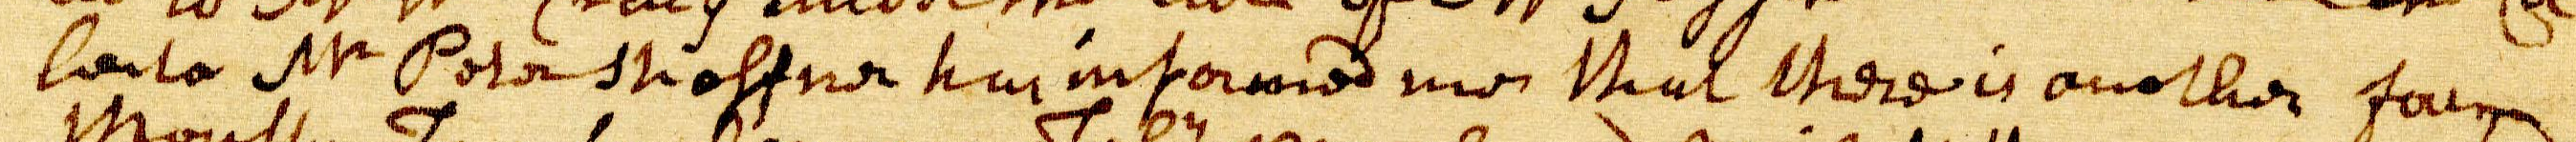lector M^r Peter Shafner has informed me that their is another four
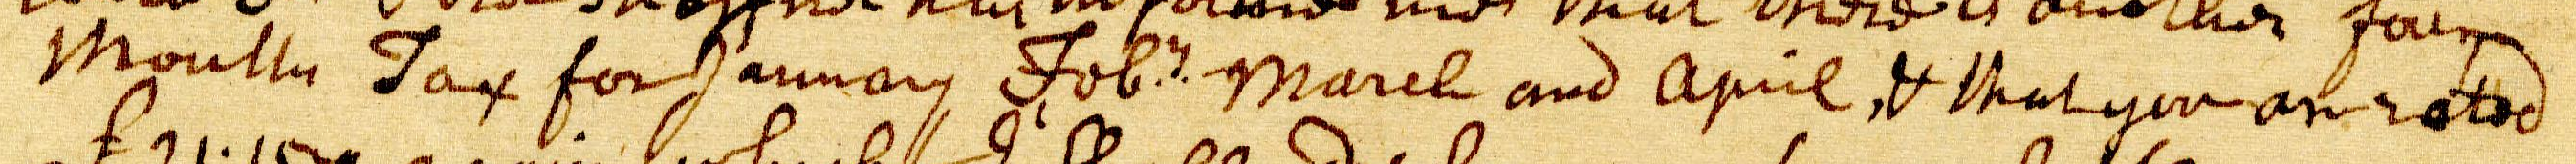Months Tax for January Feb^y. March and April, & that you are rated
